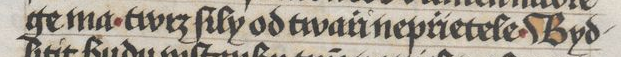ge ma.twrz ſily od twaṙi nepṙíetele.Byd¬
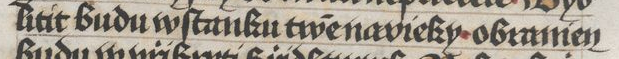litit budu wſtanku twē navieky.obranien
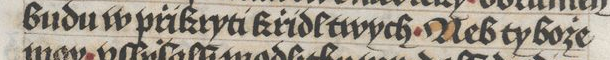budu w pṙíkrytí kṙídl twych.Neb ty boże
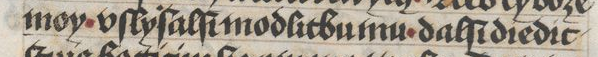moy.vſlyẛalſi modlitbu mu.dalſi diedic¬
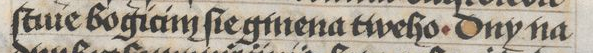ſtuíe bogícím ſie gmena tweho.Dny na
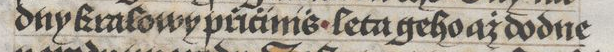dny kralowy pṙiċíníṡ.leta geho aż dodne
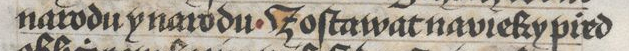narodu y narodu.Zoſtawat navieky pṙed
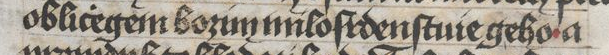obliċegem bozím míloſrdenſtuíe geho.a
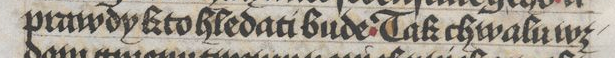prawdy kto hledatí bude.Tak chwalu wz¬
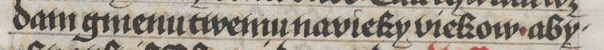dam gmenu twemu navieky víekow.aby¬
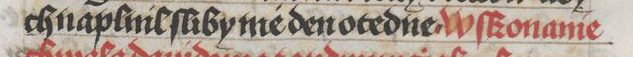ch naplnil ſliby mé den otedne.Wſkonaníe
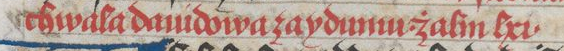chwala dauidowa zaydumu.żalm lxi.
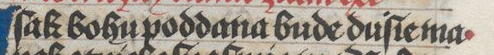ſak bohu poddana bude duẛie ma.
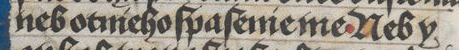neb otníeho ſpaſeníe me.Neb y
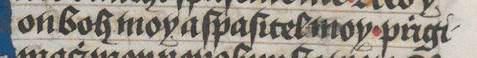on boh moy a ſpaſitel moy.pṙigi¬
